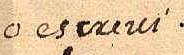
o escreui.
